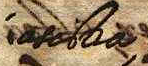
asistia
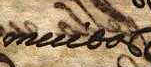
muitas
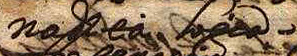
na dita Logia
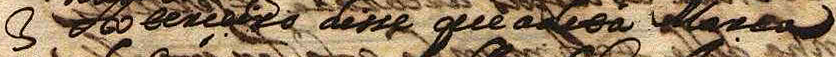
3 Ao terceiro disse que a dita Maria
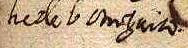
he de bom Juizo.
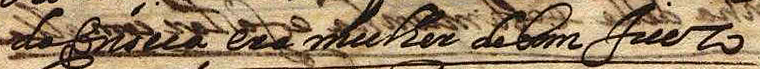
da fonseca, era mulher de bom Juizo
